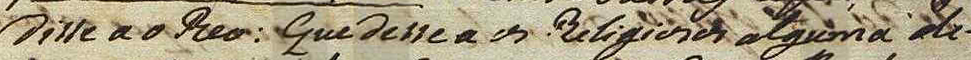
disse ao Reo: Que desse aos Religiosos alguma de
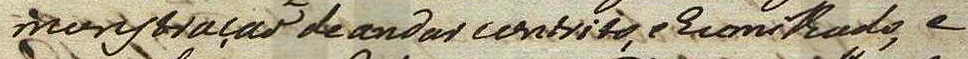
monstraçaõ de andar contrito, e humilhado, e
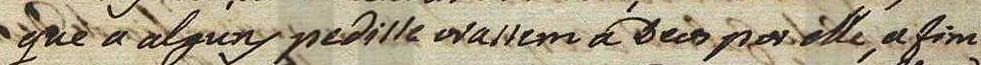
que a alguns pedisse orassem a Deos por elle, afim
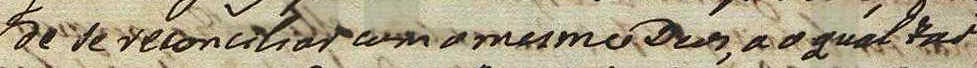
de se reconciliar com o mesmo Deos, ao qual taõ
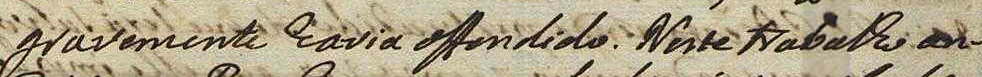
gravemente havia offendido. Neste trabalho an
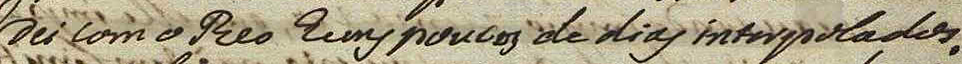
dei com o Reo huns poucos de dias interpolados,
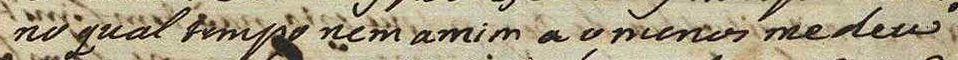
no qual tempo nem a mim ao menos me deu
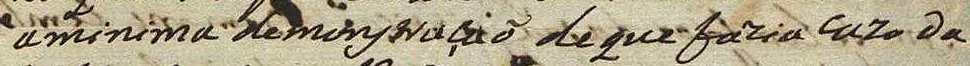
a minima demonstraçaõ de que fazia cazo da
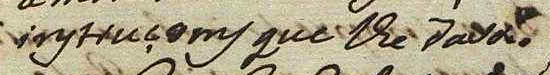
instruçoms que lhe dava.
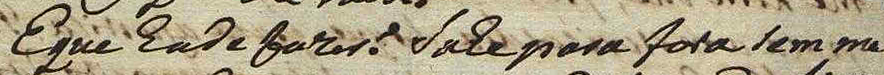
E que ha de fazer. Sahe para fora sem me
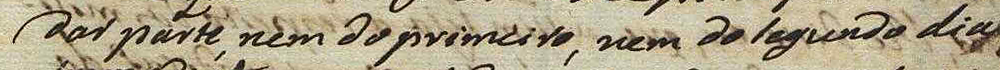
dar parte, nem do primeiro, nem do segundo dias
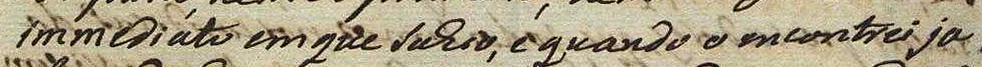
immediato em que sahio, e quando o encontrei ja
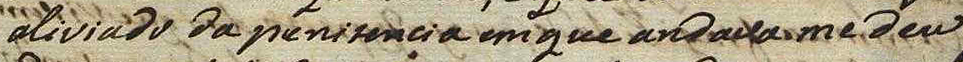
aliviado da penitencia em que andava me deu
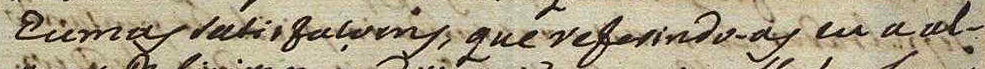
humas satisfaçoens, que referindo-as eu a al
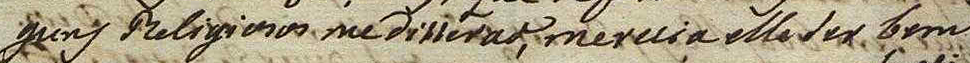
guns Religiosos me disseraõ, merecia elle ser bem
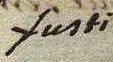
fusti
